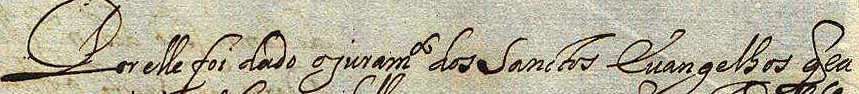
Por elle foi dado o juramto dos Sanctos Euangelhos q̄ eu
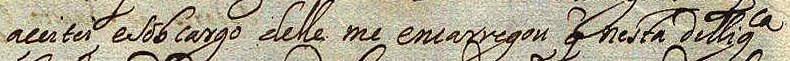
aceitei, e sob cargo delle me encarregou, q̄ nesta delligca
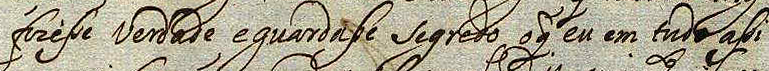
fizesse verdade, e guardasse segredo o q̄ eu em tudo assi
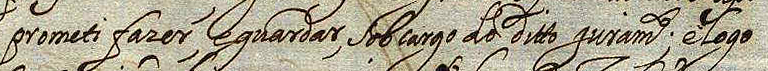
prometi fazer, e guardar, sob cargo do ditto juramto; e logo
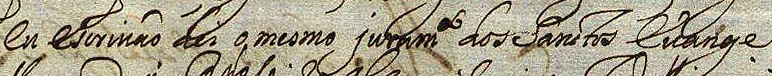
eu escriuaõ dei o mesmo juramto dos Sanctos Euange
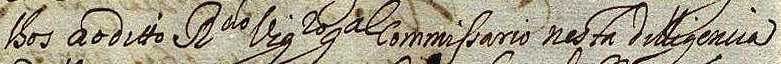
lhos ao ditto Rdo Vigro gal commissario nesta dilligencia
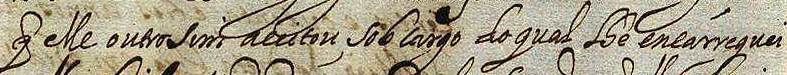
q̄ elle outrosim aceitou, sob cargo do qual lhe encarreguei
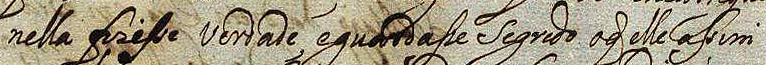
nella fizesse verdade, e guardasse Segredo o q̄ elle assim
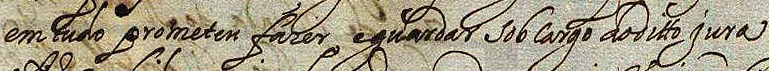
em tudo prometeu fazer e guardar sob cargo do ditto jura
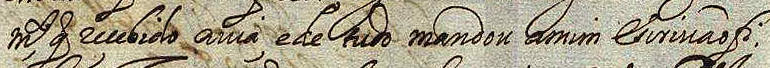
mto, q̄ recebido auia, e de tudo mandou a mim escriuaõ fi
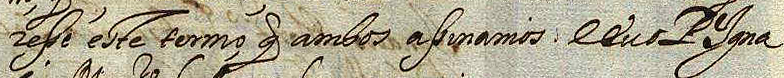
zesse este termo, q̄ ambos assinamos. e eu o Pe Igna
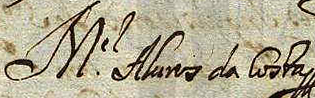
M.el Alures da Costa
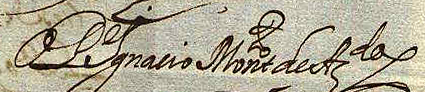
O Pe Ignacio Montro de Azdo
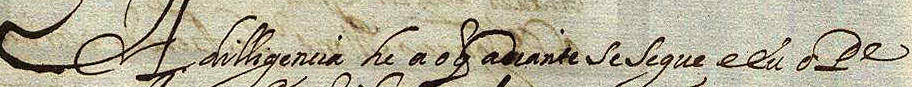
A dilligencia he a o q̄ adiante se segue, e eu o Pe
